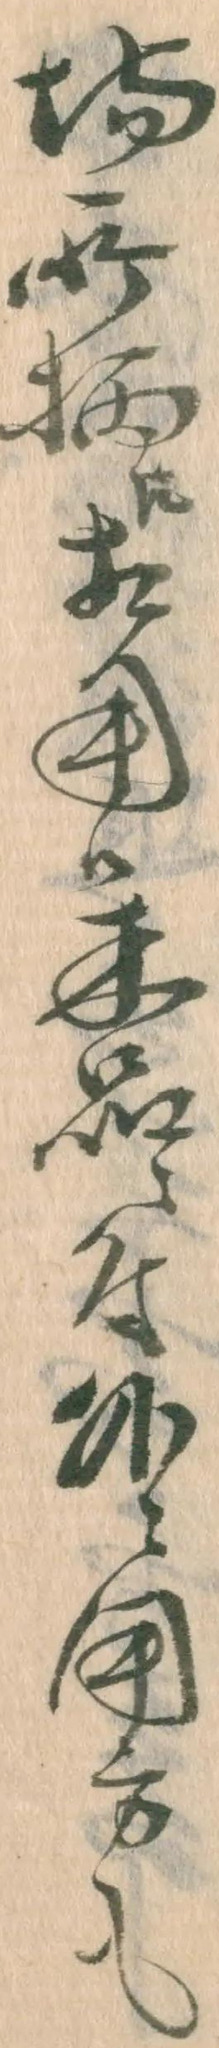場所柄え相用候木品ニ付外ニ用方も
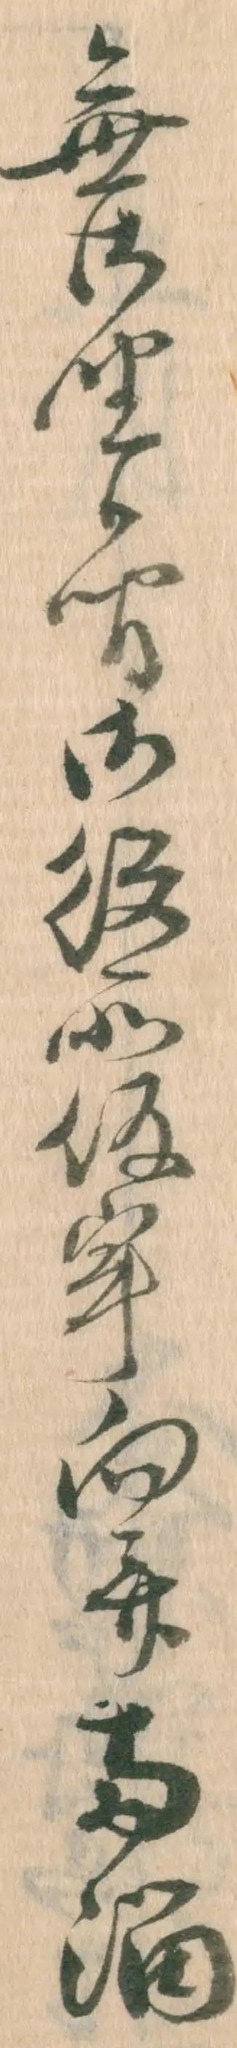無御座候間御役所仮牢向幷両溜
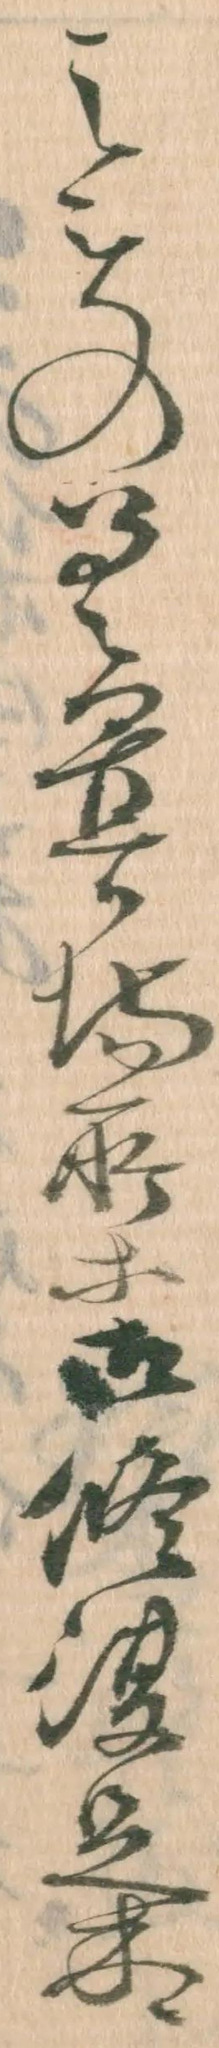之もの差置候場所等御修復足木ニ
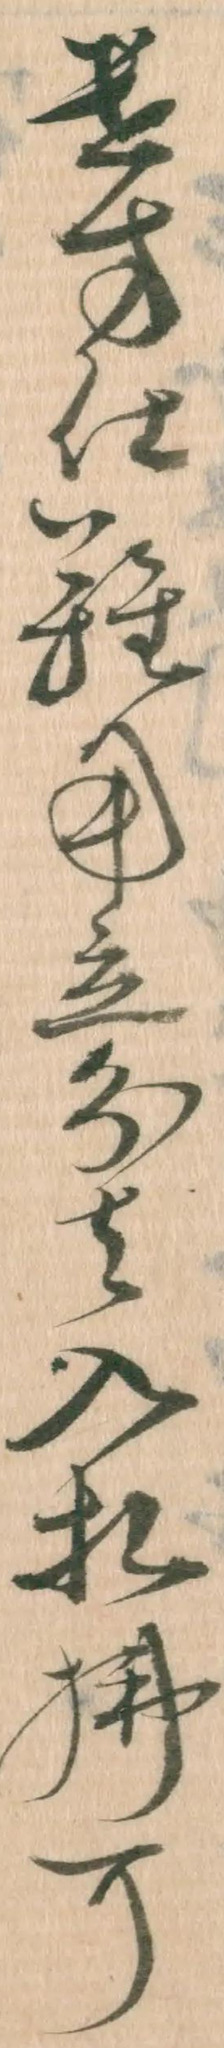遣方仕難用立分は入札払可
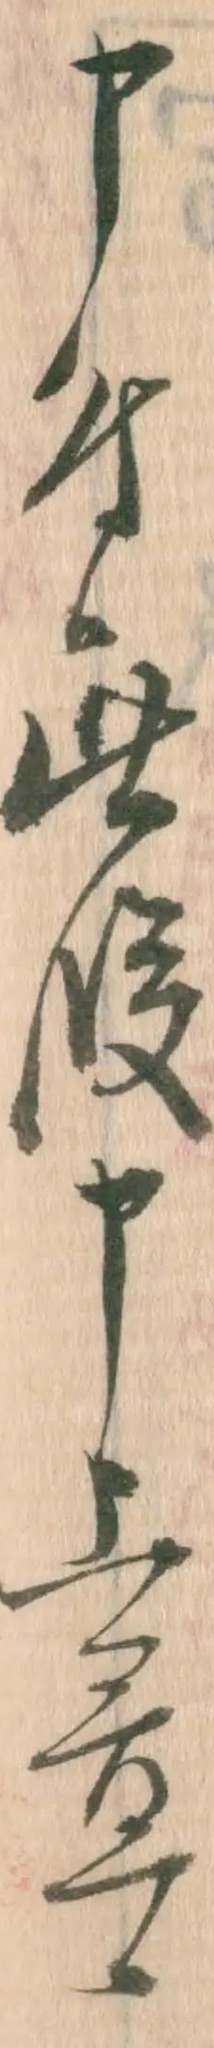申付候此段申上置候
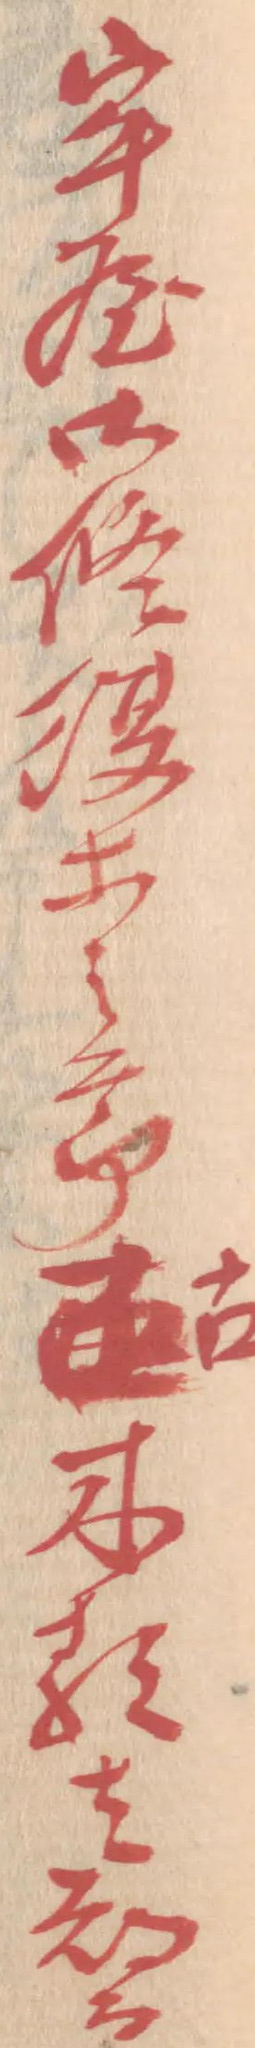「牢屋御修復等之節古木類を都て
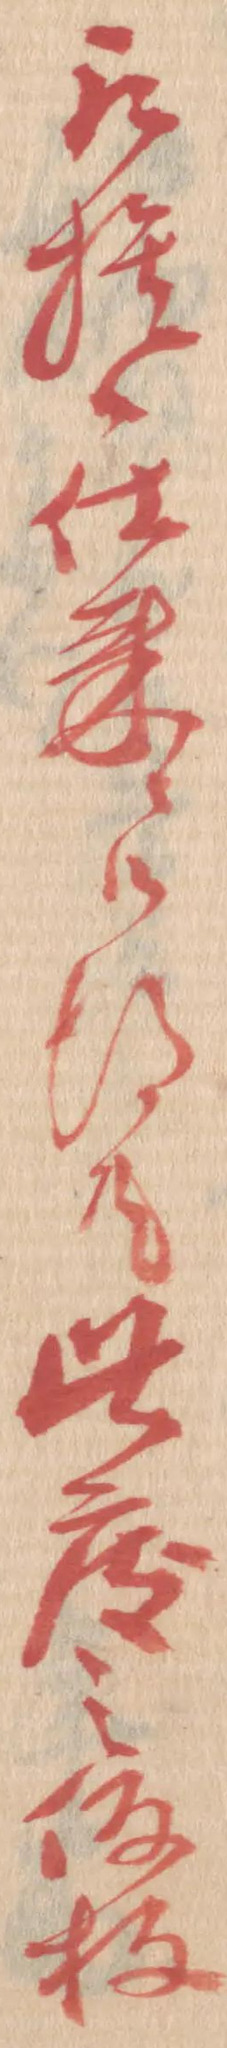取捨候仕来ニ候得共此度之仮板
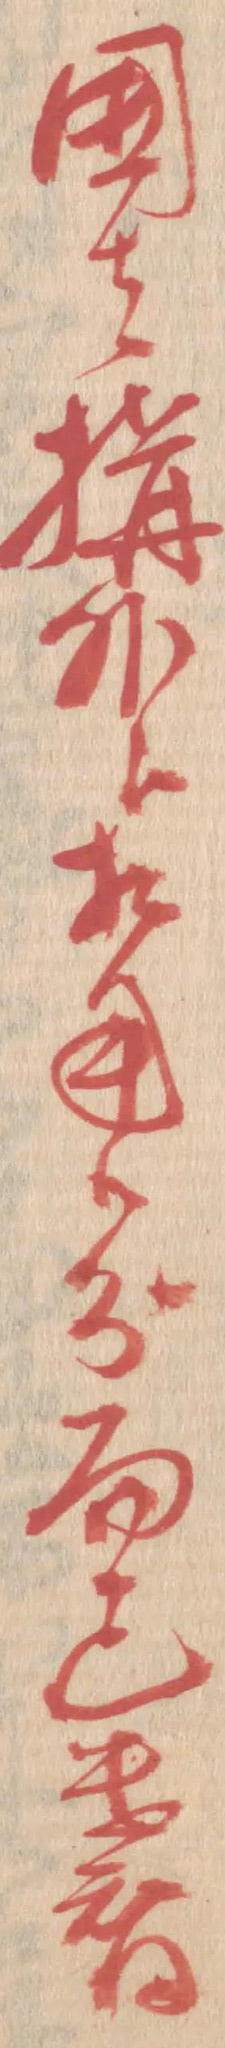囲は構外え相用候分而已遣替
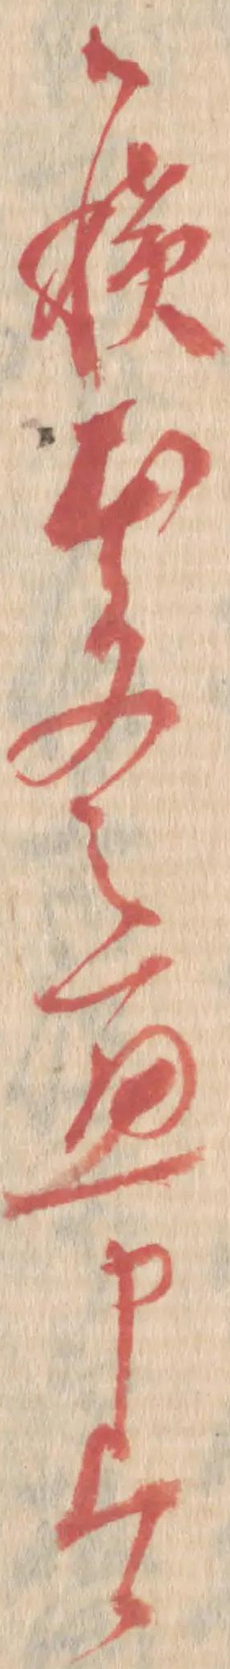候積本文之通申上候」
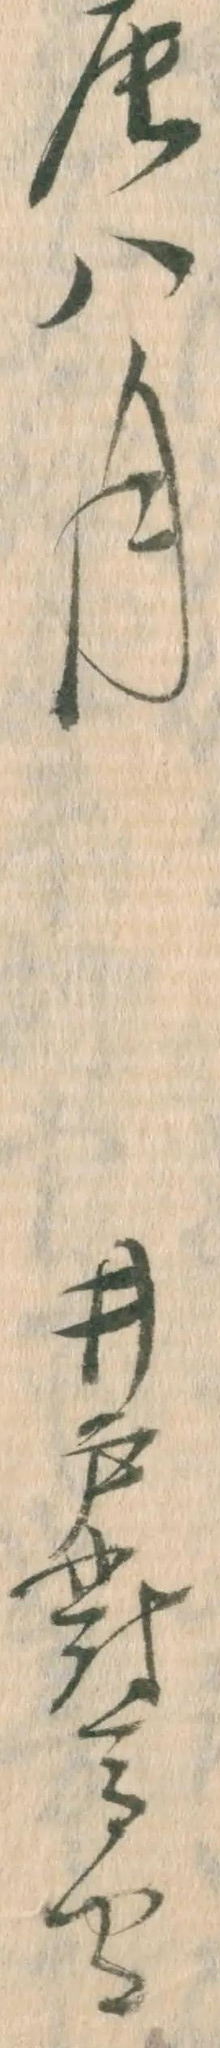辰八月井戸対馬守

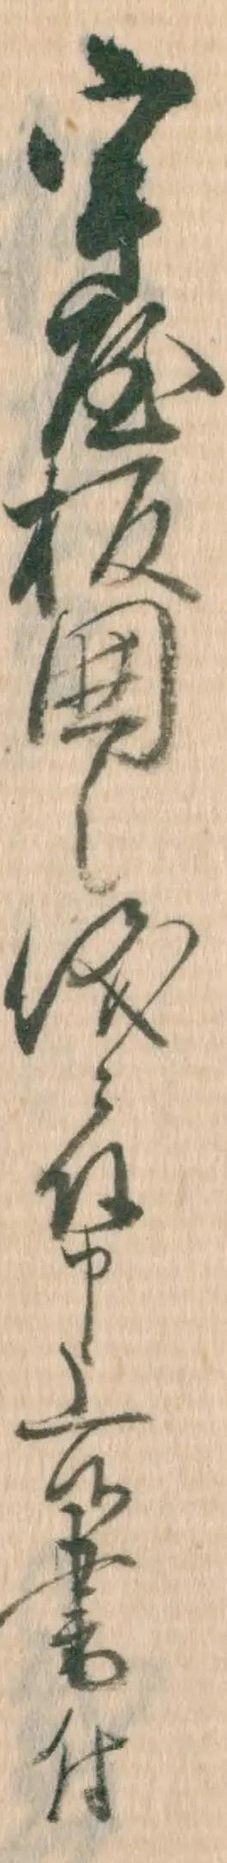│牢屋板囲之儀ニ付申上候書付
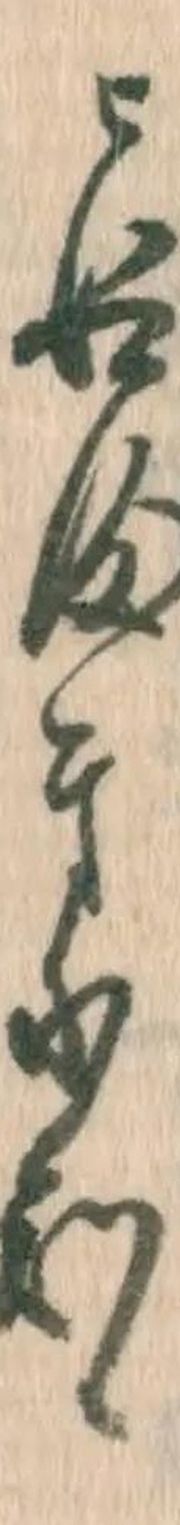│被仰渡奉承知候
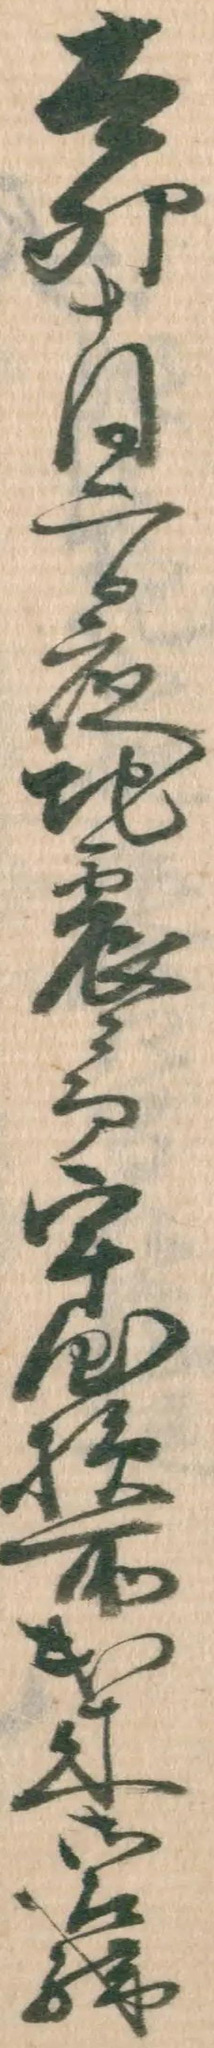去卯十月二日夜地震ニて牢屋損所出来御取締
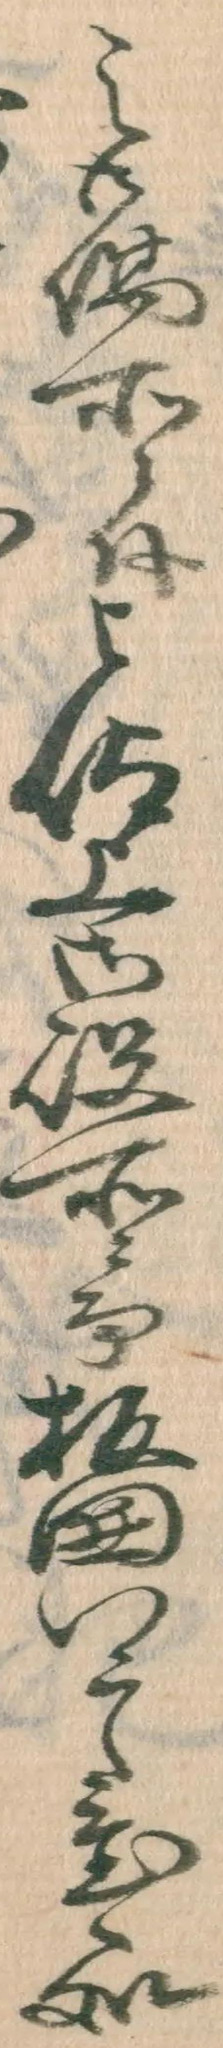之御場所ニ付被仰上御役所ニて板囲いたし置候処
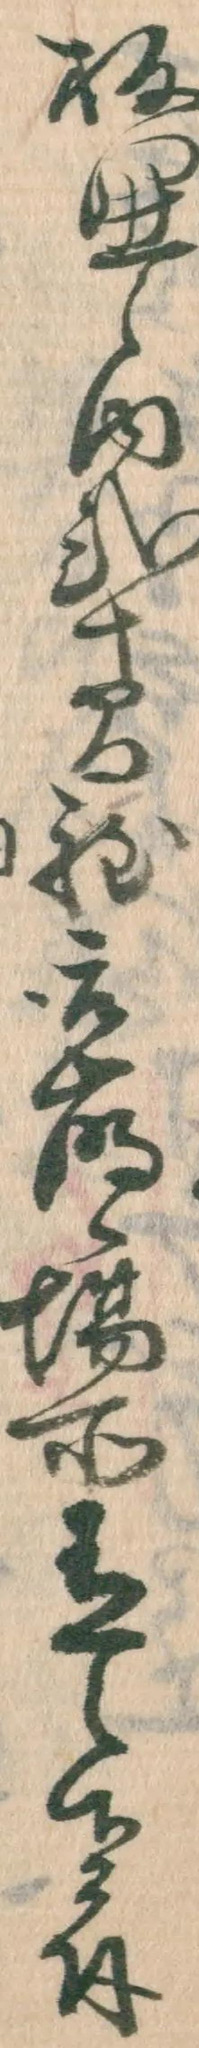板囲之内弐十間程差崩候場所有之候ニ付
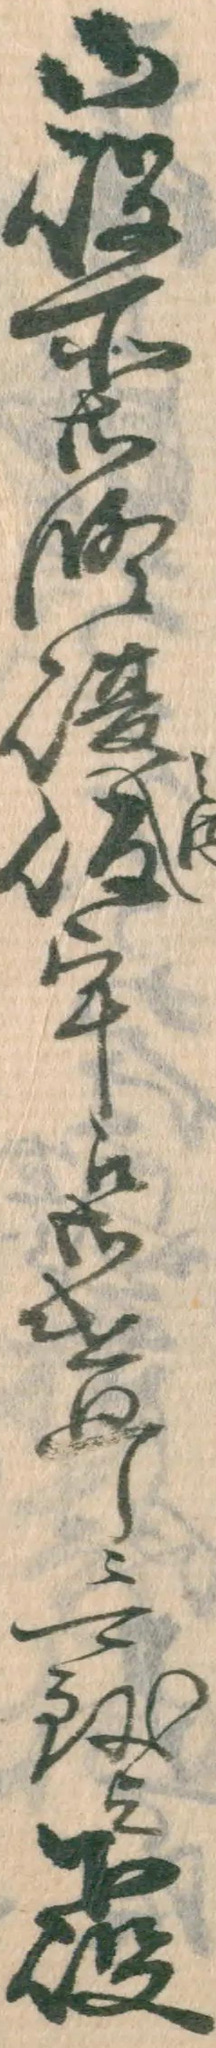御役所御修復之内仮牢え御遣廻しニ可致と下役
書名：七十冊物類集 71巻. [44] 四十三 牢屋敷御普請御修覆地震ニ付骨折候牢屋掛御褒美之部
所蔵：国立国会図書館 National Diet Library, JAPAN
